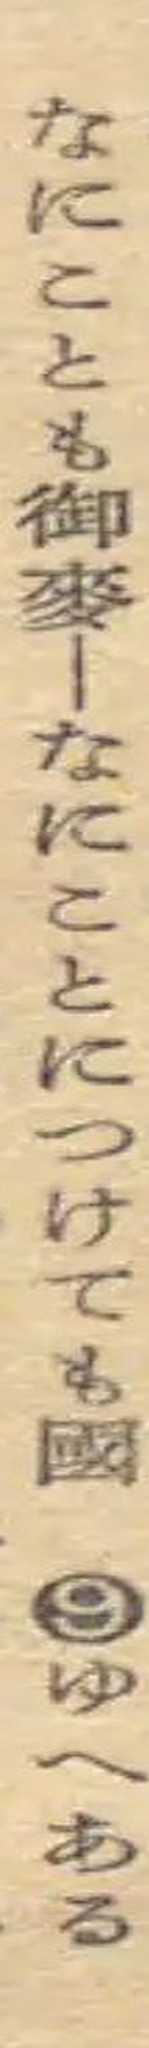なにことも御麦―なにことにつけても国❾ゆへある
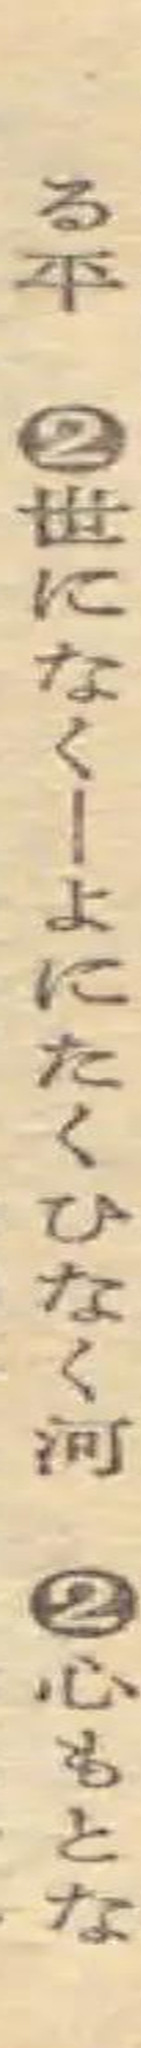る平➋世になく―よにたくひなく河➋心もとな
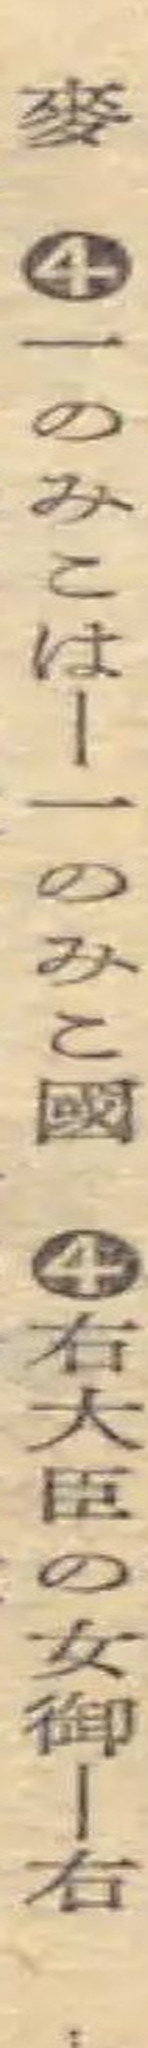麦❹一のみこは―一のみこ国❹右大臣の女御―右
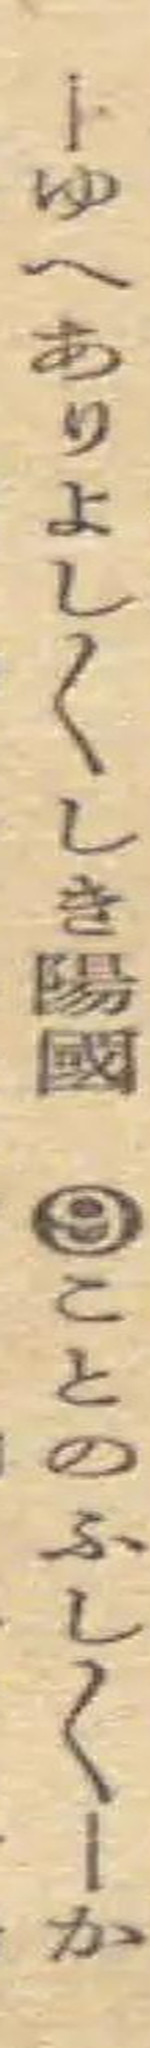―ゆへありよし〳〵しき陽国❾ことのふし〳〵―か
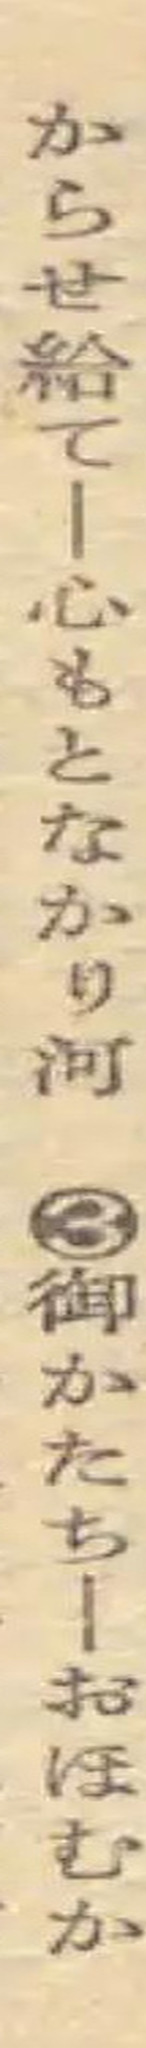からせ給て―心もとなかり河❸御かたち―おほむか
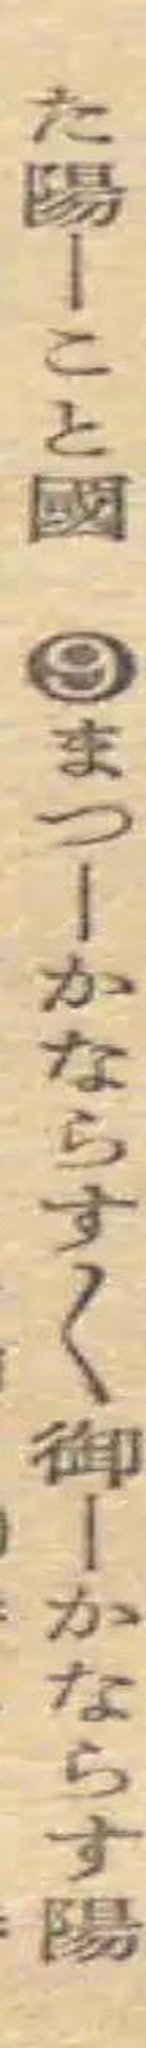た陽―こと国❾まつ―かならす〳〵御―かならす陽
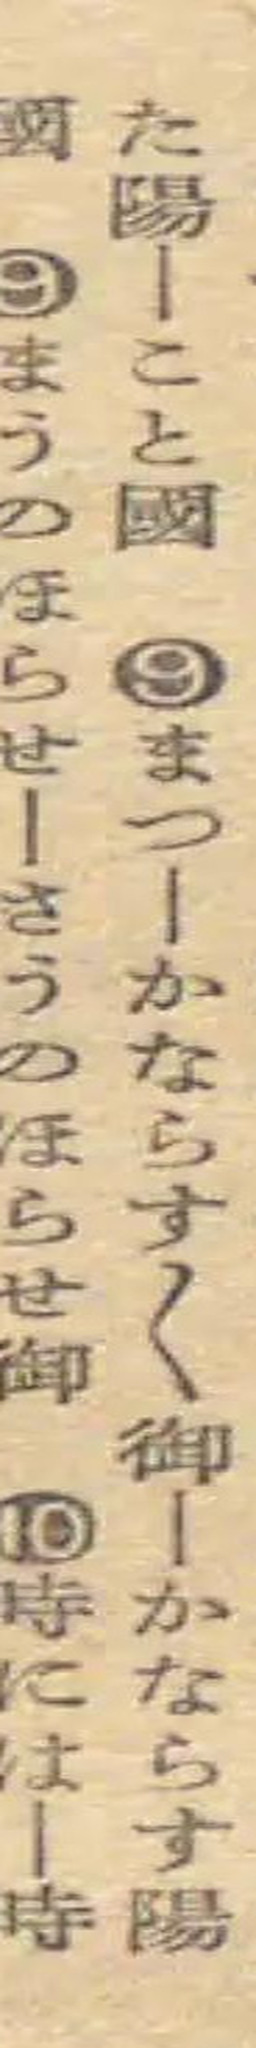国❾まうおほらせ―さうのほらせ御❿時には―時
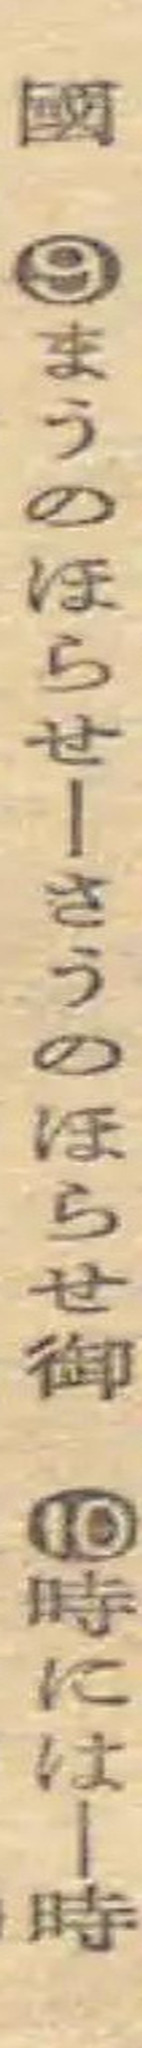国❾まうおほらせ―さうのほらせ御❿時には―時
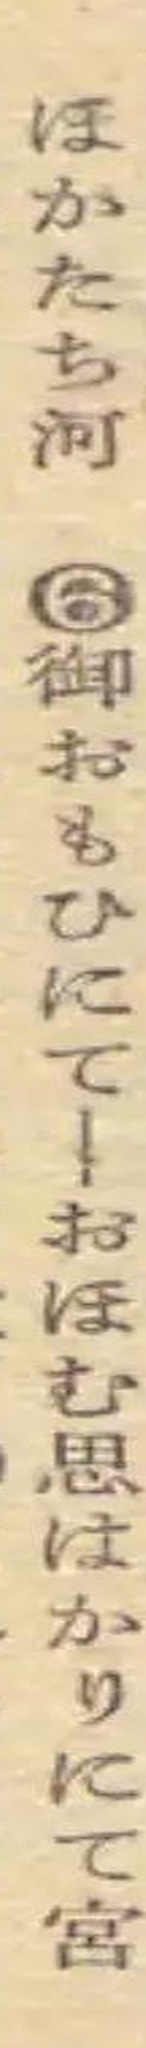ほかたち河❻御おもひにて―おほむ思はかりにて宮
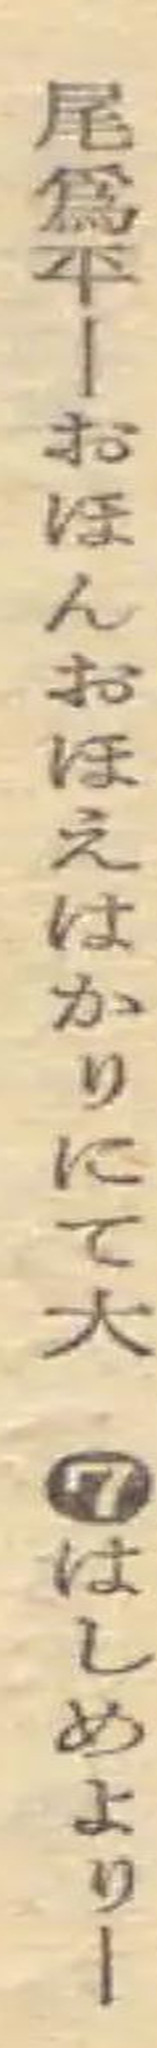尾為平―おほんおほえはかりにて大❼はしめより―
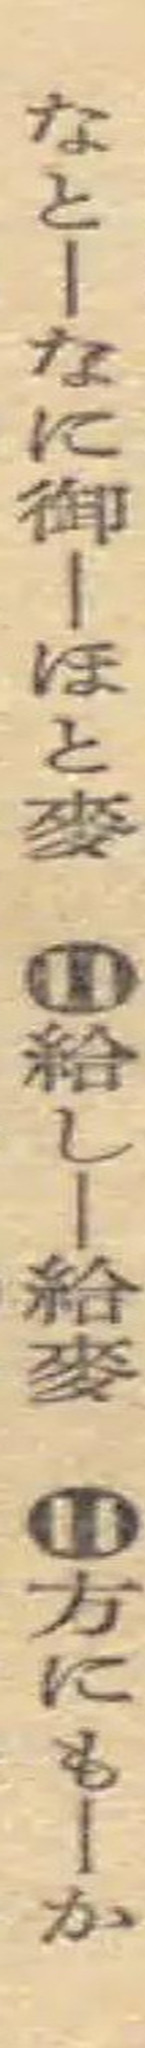なと―なに御―ほと麦⓫給し―給麦⓫方にも―か
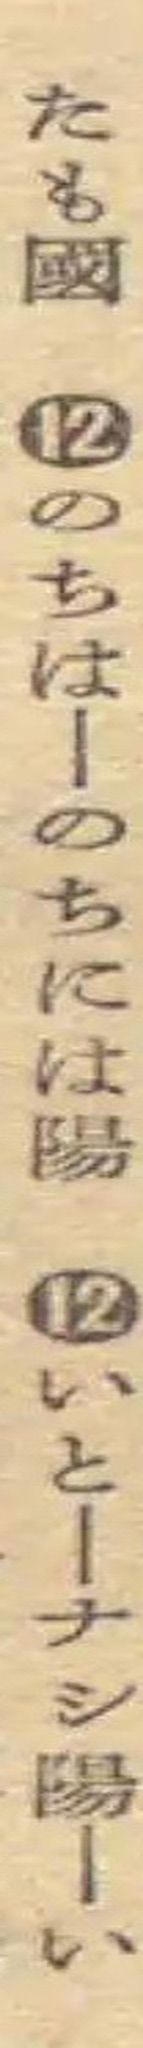たも国⓬のちは―のちには陽⓬いと―ナシ陽―い
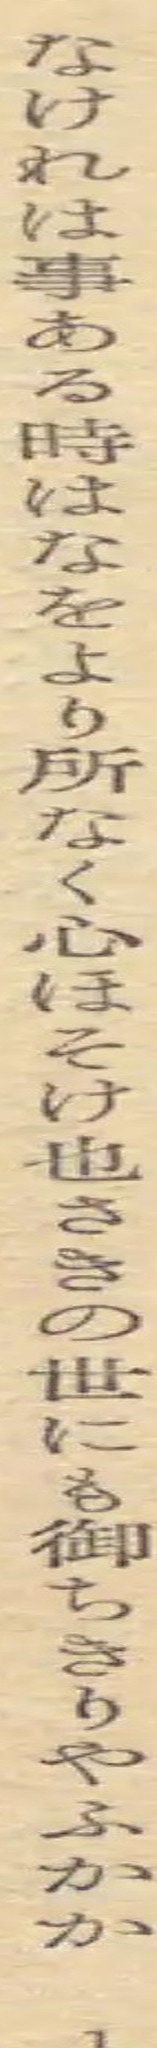なけれは事ある時はなをより所なく心ほそけ也さきの世にも御ちきりやふかか
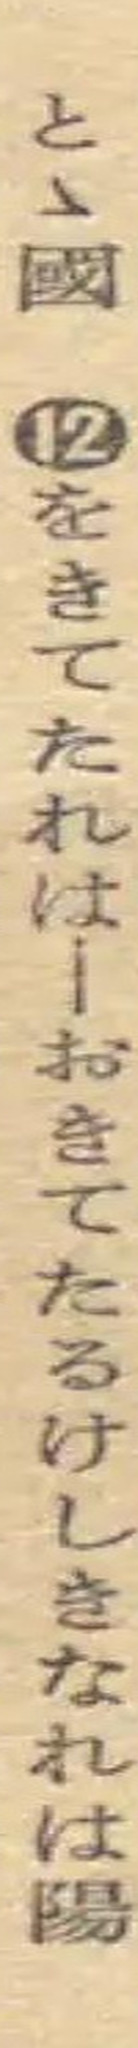とゝ国⓬をきてたれは―おきてたるけしきなれは陽
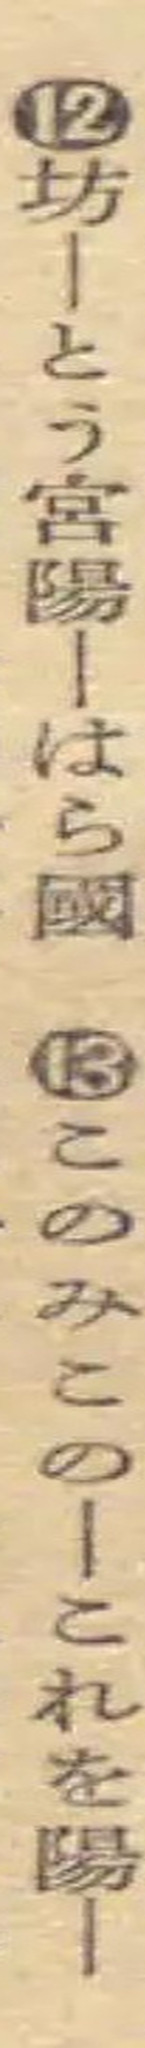⓬坊―とう宮陽―はら国⓭このみこの―これを陽―
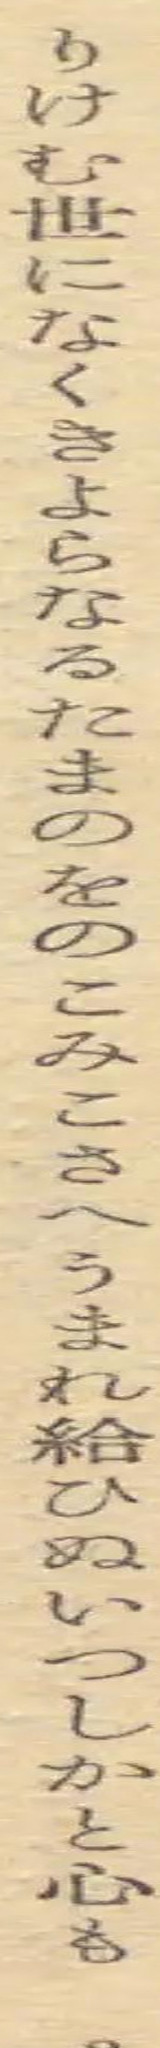りけむ世になくきよらなるたまのをのこみこさへうまれ給ひぬいつしかと心も
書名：校異源氏物語.
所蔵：国立国会図書館 National Diet Library, JAPAN
